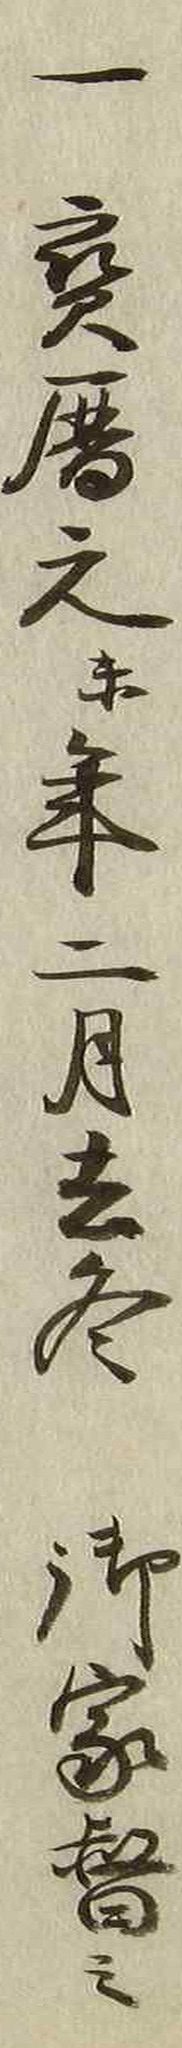一宝暦元未年二月去冬御家督之
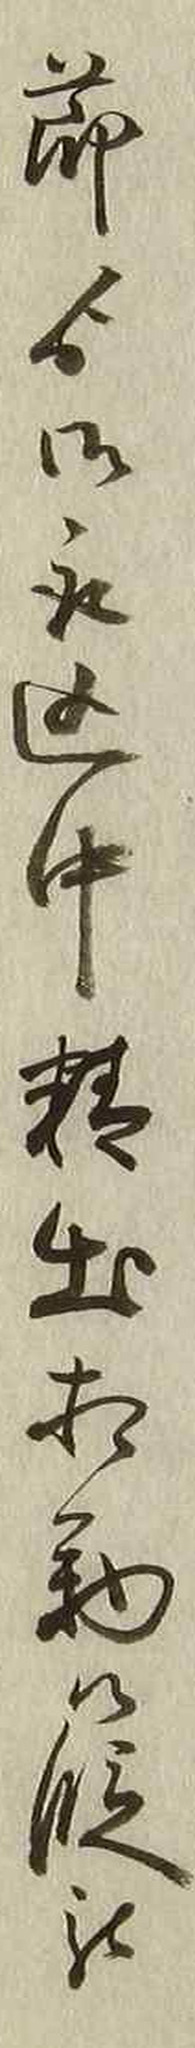節ゟ御取込中精出相勤候段被
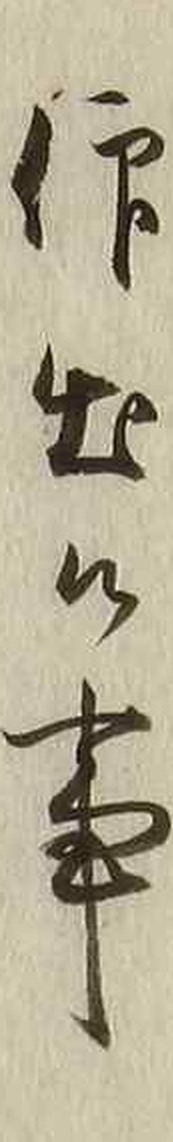仰出候事
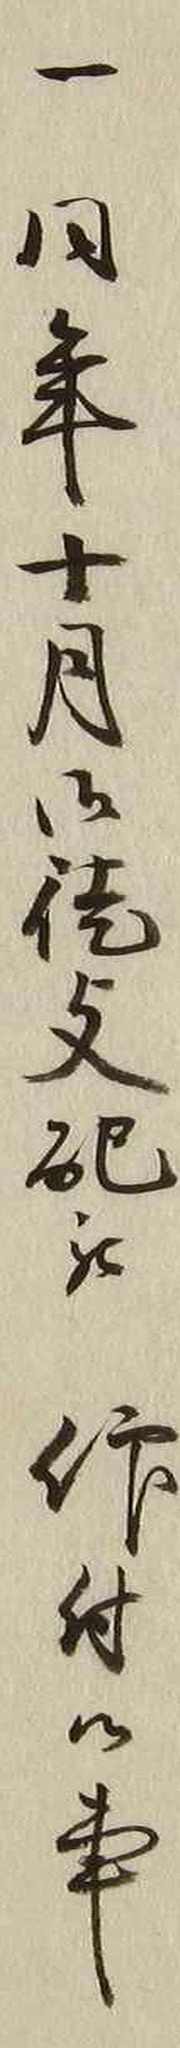一同年十月御徒支配被仰付候事
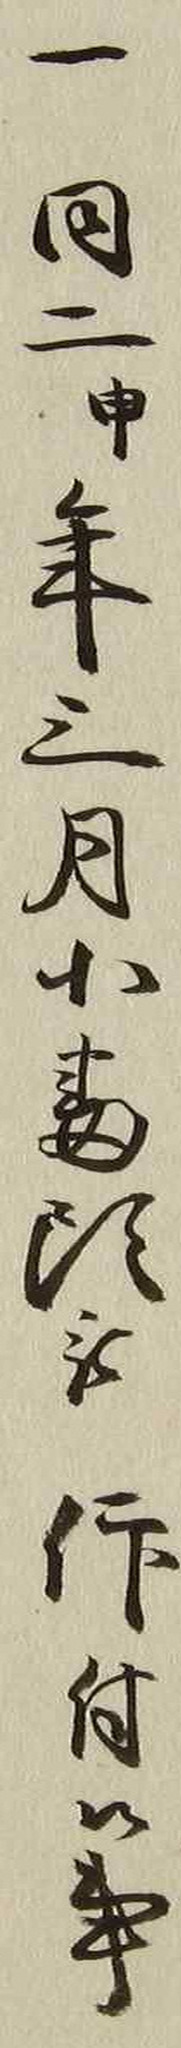一同二申年三月小番頭被仰付候事
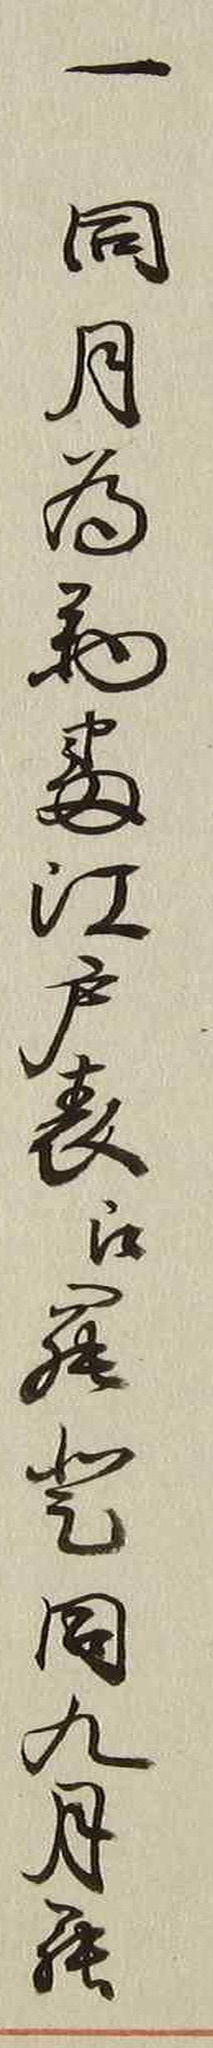一同月為勤番江戸表江罷登同九月罷
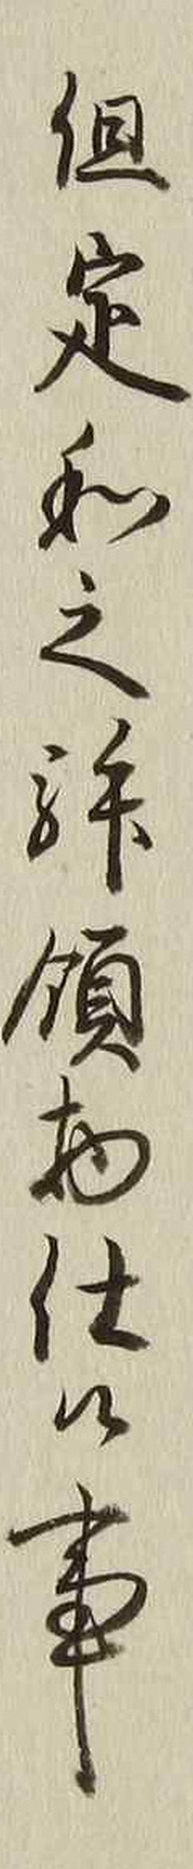但定和之拝領物仕候事
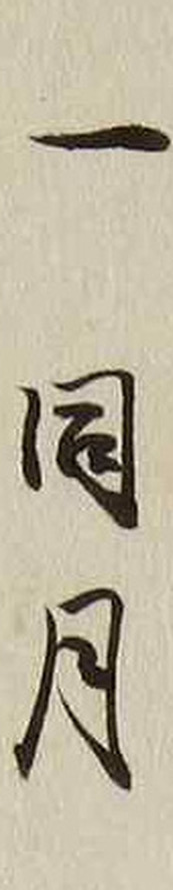一同月
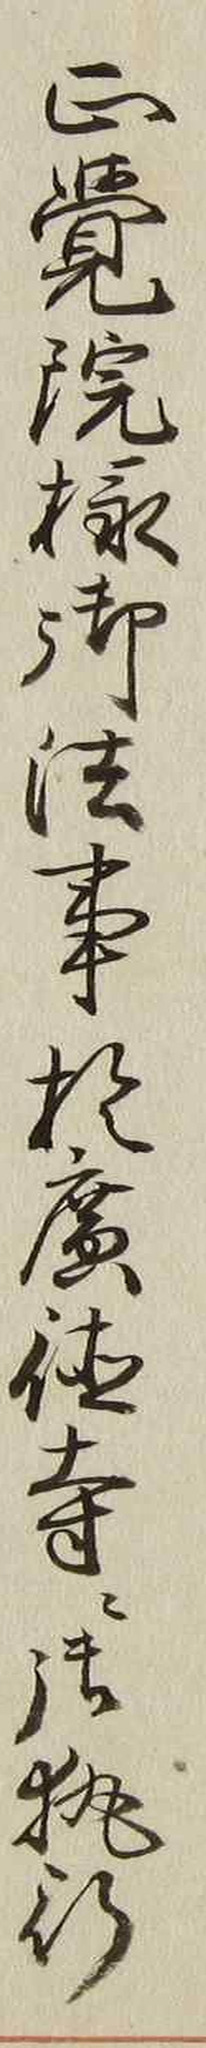正覚院様御法事於広徳寺ニ御執行
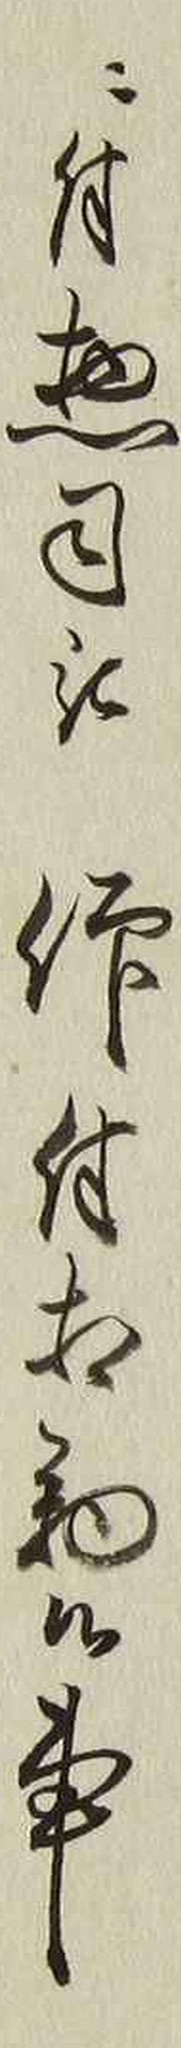ニ付惣司被仰付相勤候事
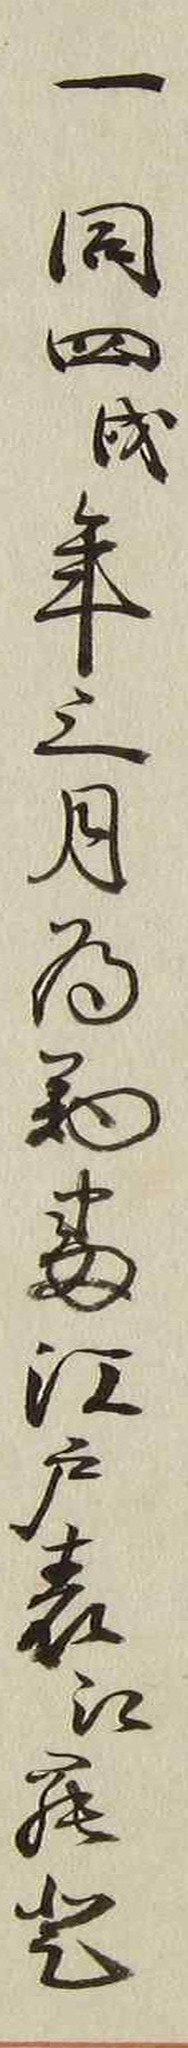一同四戌年三月為勤番江戸表江罷登
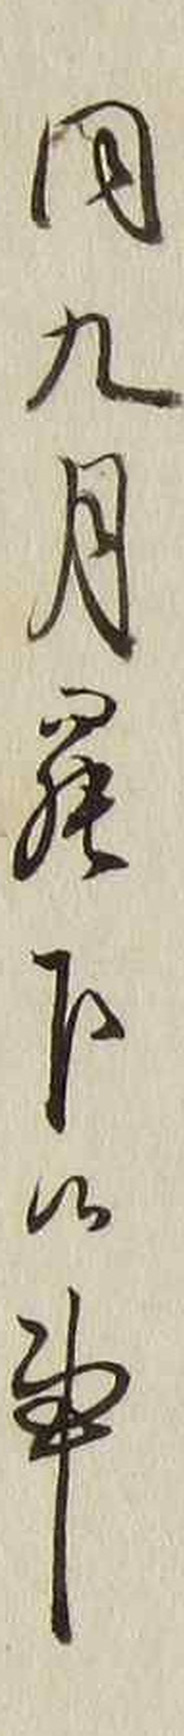同九月罷下候事
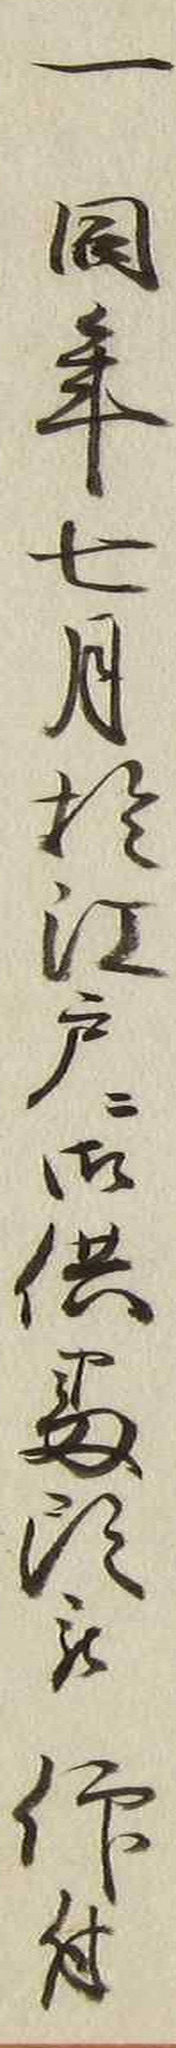一同年七月於江戸ニ御供番頭被仰付
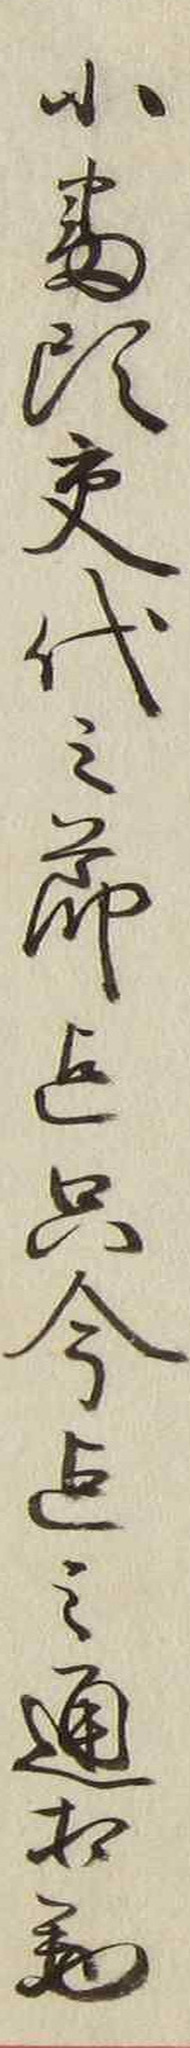小番頭交代之節迄只今迄之通相勤

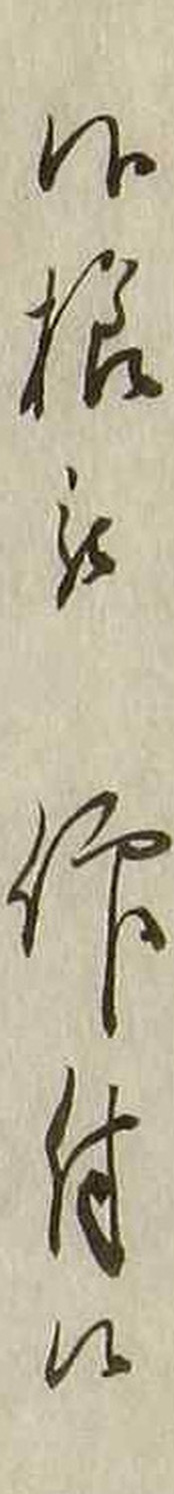候様被仰付候
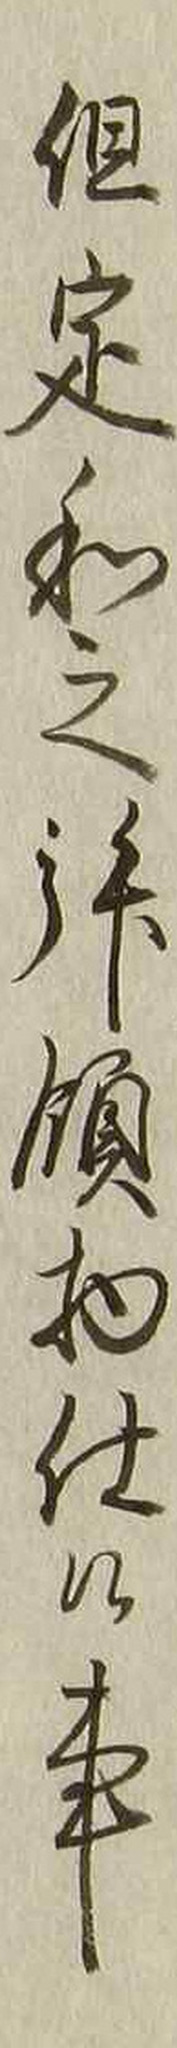但定和之拝領物仕候事
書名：諸士系譜　巻之15　い之部15
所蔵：会津若松市立会津図書館
